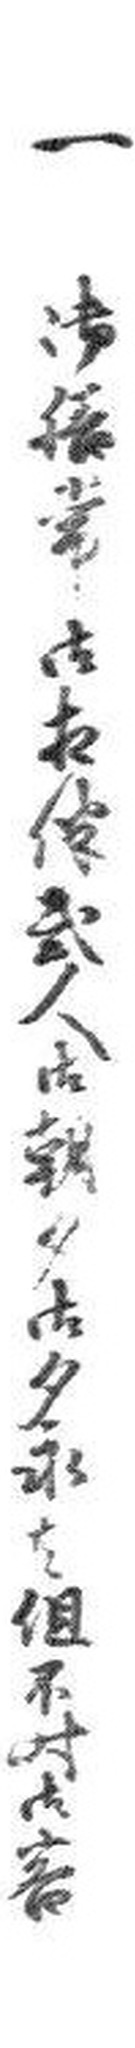一御膳常御相伴弐人御朝夕御夕永共但不時御客
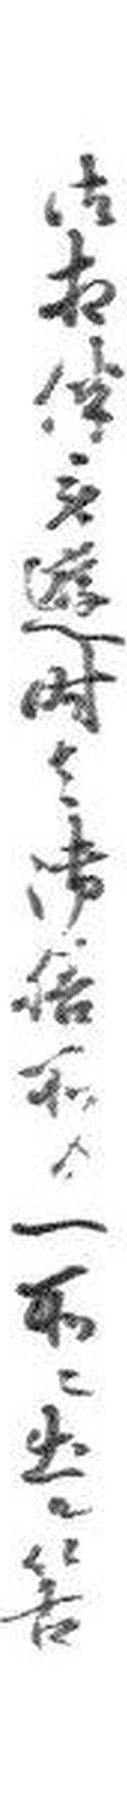御相伴被遊時者御膳所ゟ一所ニ出ル筈

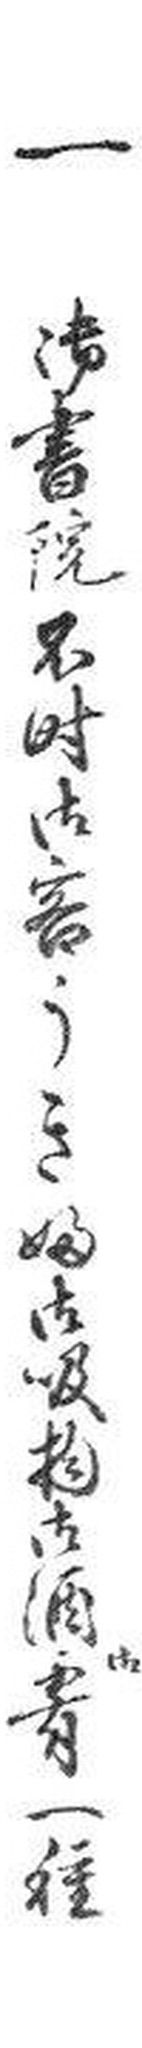一御書院不時御客うきふ御吸物御酒御肴一種
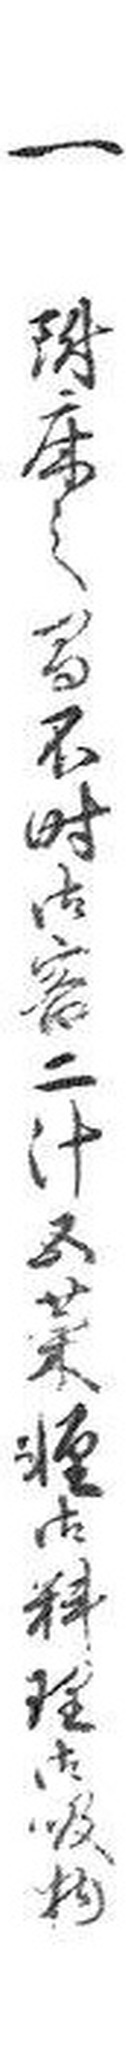一附床之間不時御客二汁五菜軽御料理御吸物
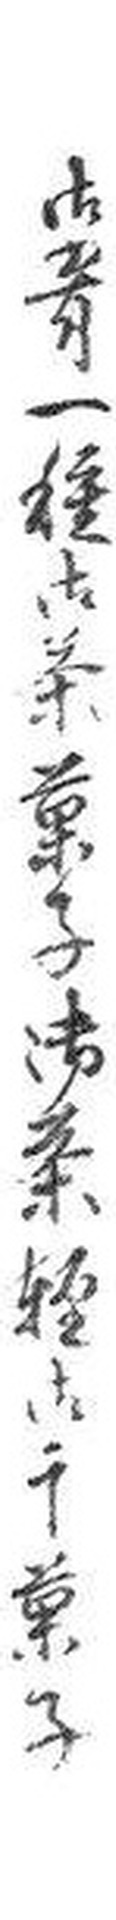御肴一種御茶菓子御茶軽御干菓子
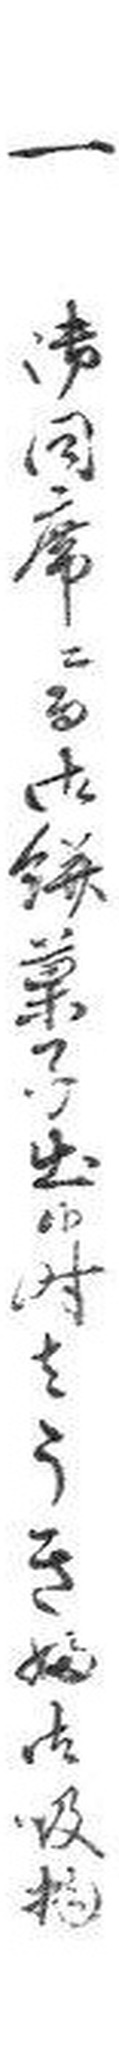一御同席ニ而御餅菓子出候時者うきふ御吸物
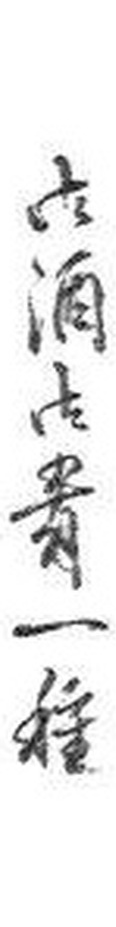御酒御肴一種
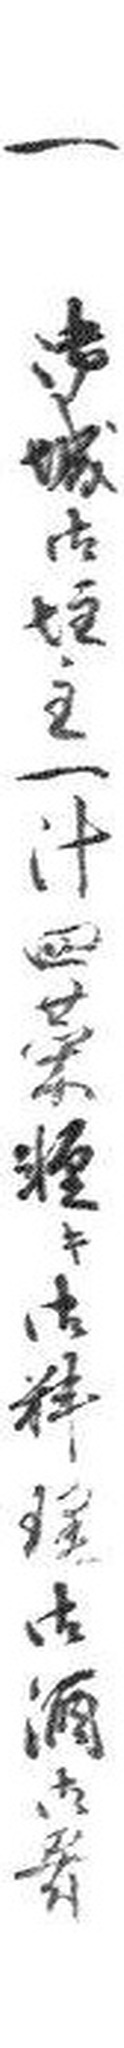一御城御坊主一汁四菜軽キ御料理御酒御肴
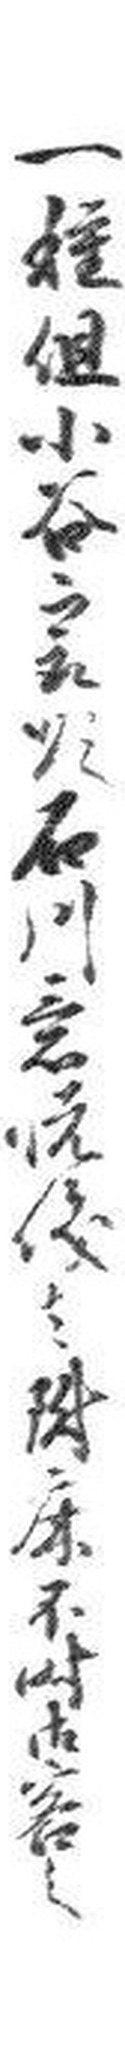一種但小谷最順石川意悦儀者附床不時御客之
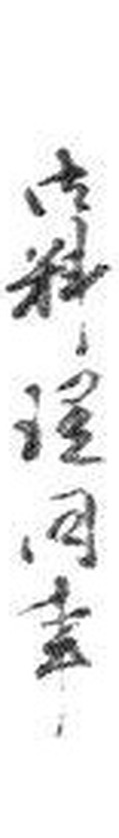御料理同事
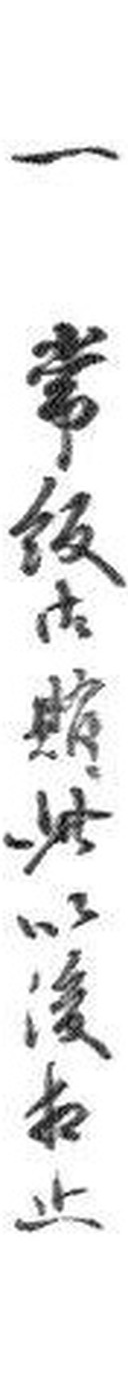一常飯御賄此以後相止
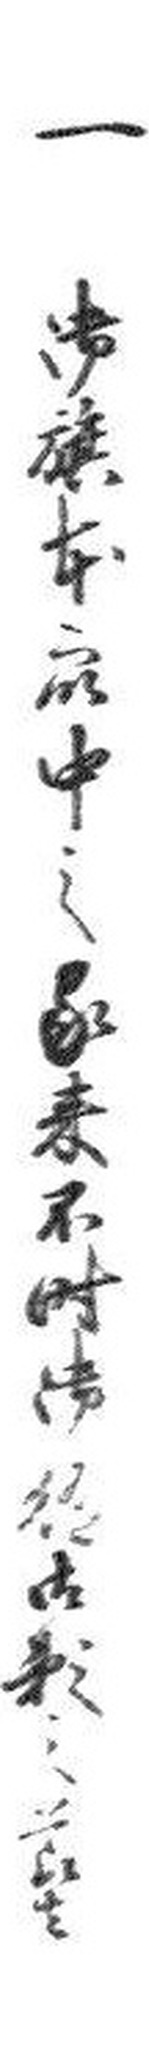一御旗本衆中之家来不時御賄御頼之節者
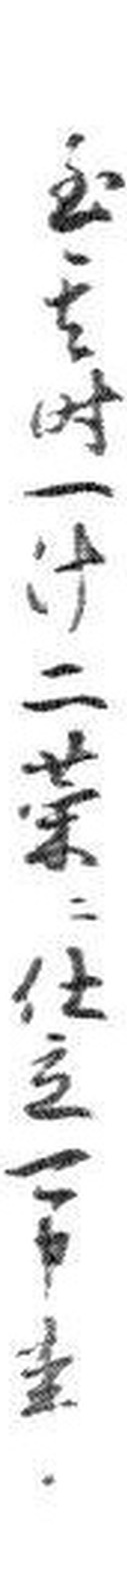至其時一汁二菜ニ仕立可申事
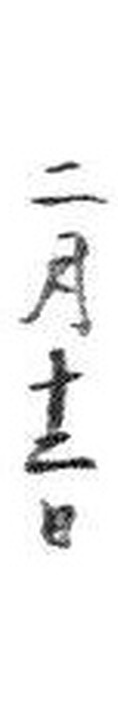二月十二日
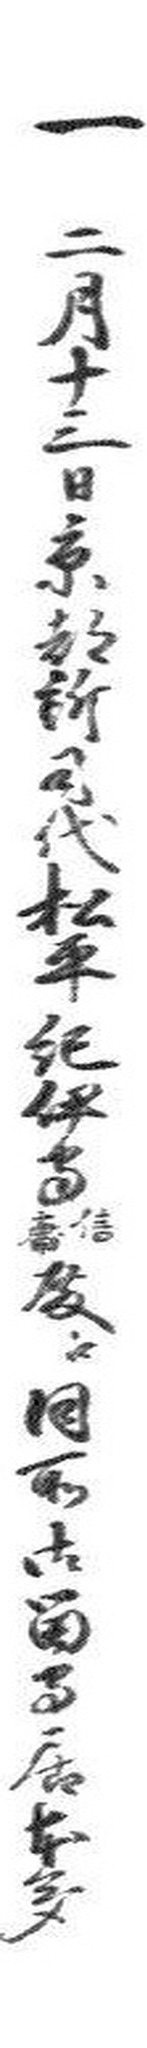一二月十三日京都所司代松平紀伊守信庸殿江同所御留守居本多
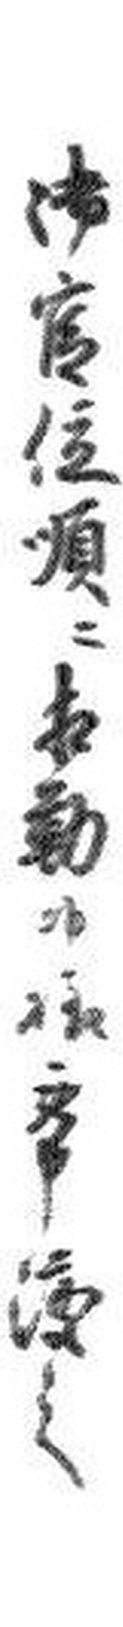御官位順ニ相勤候様被申渡之
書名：家譜 二十八 吉邦公 従宝永七年七月五日到正徳元年十二月
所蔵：福井県文書館 Fukui Prefectural Archives
